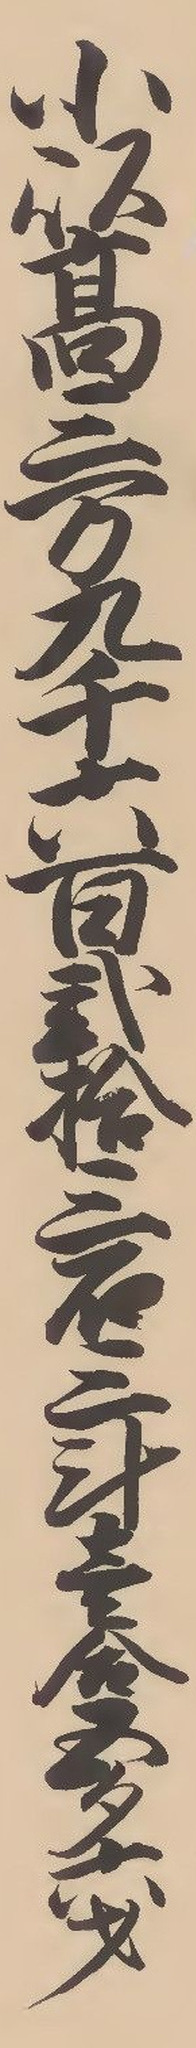小以高三万九千六百弐拾三石三斗壱合五勺六才

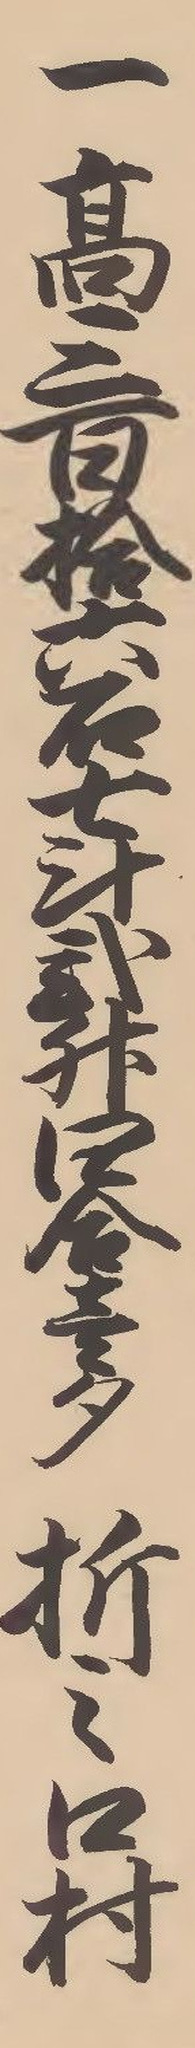一高三百拾六石七斗弐升四合壱勺折之口村
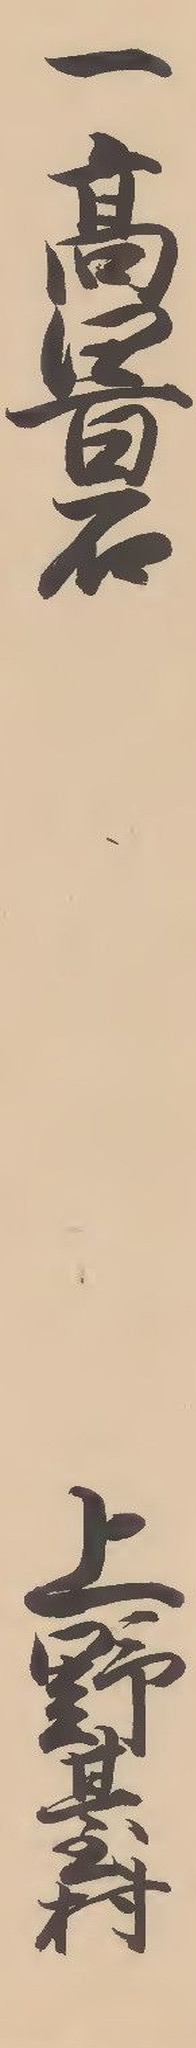一高四百石上野台村
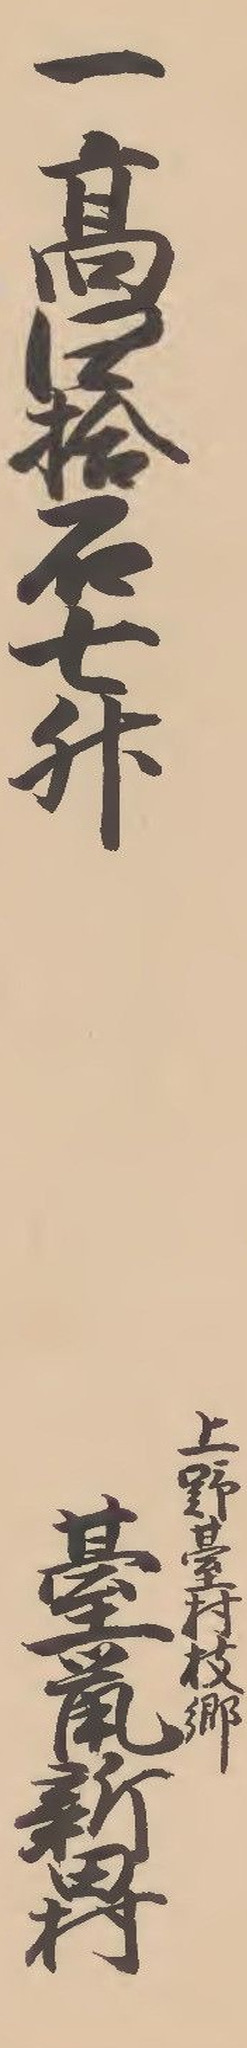一高四拾石七升台鼠新田村
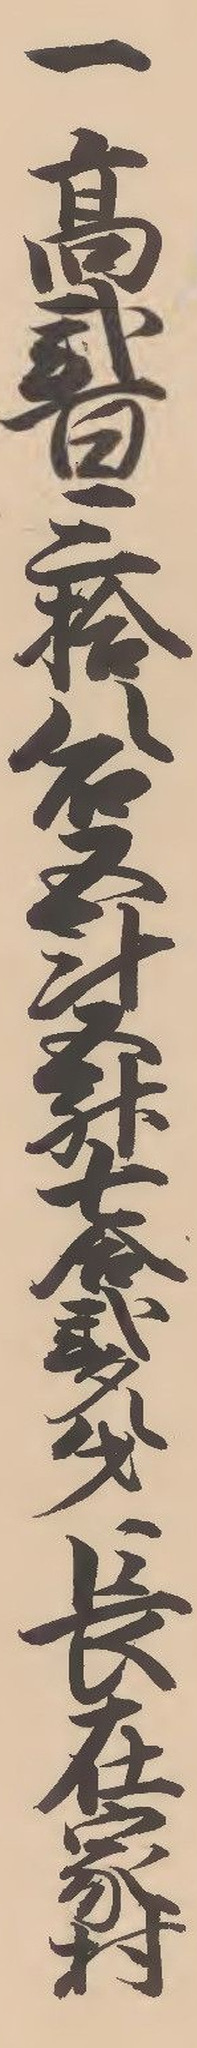一高弐百三拾八石五斗五升七合弐勺八才長在家村
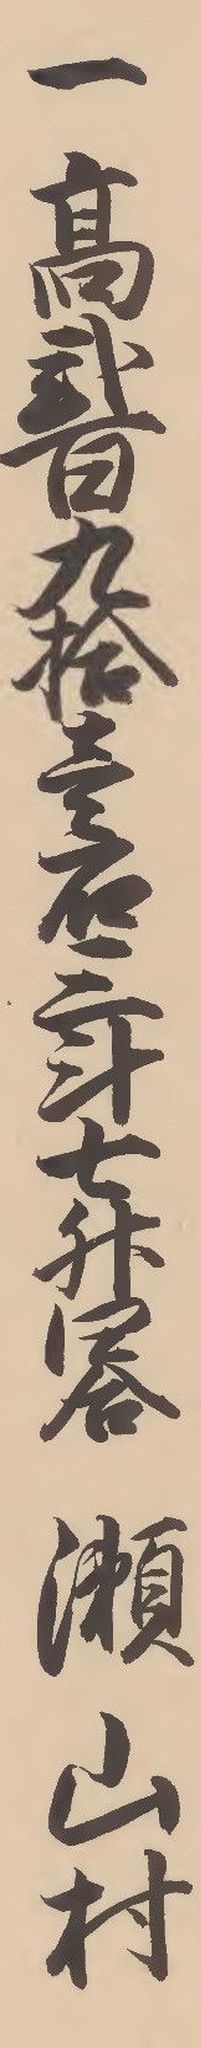一高弐百九拾壱石三斗七升四合瀬山村
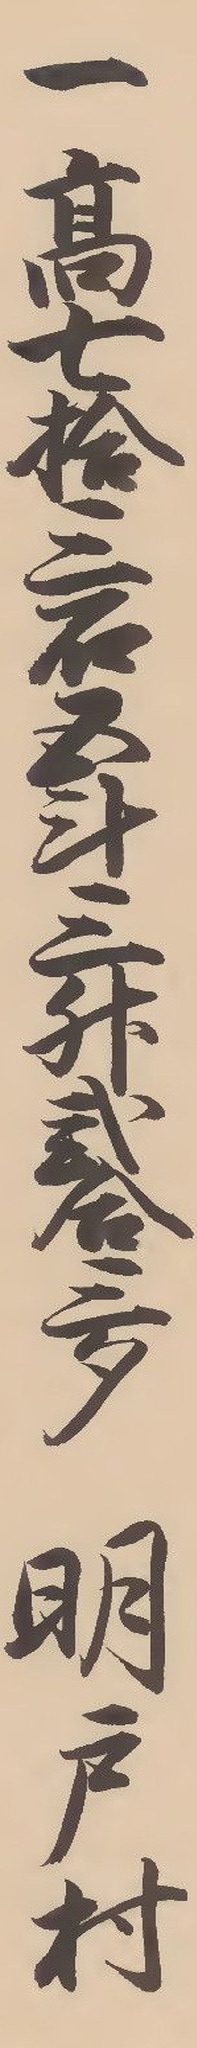一高七拾三石五斗三升弐合三勺明戸村
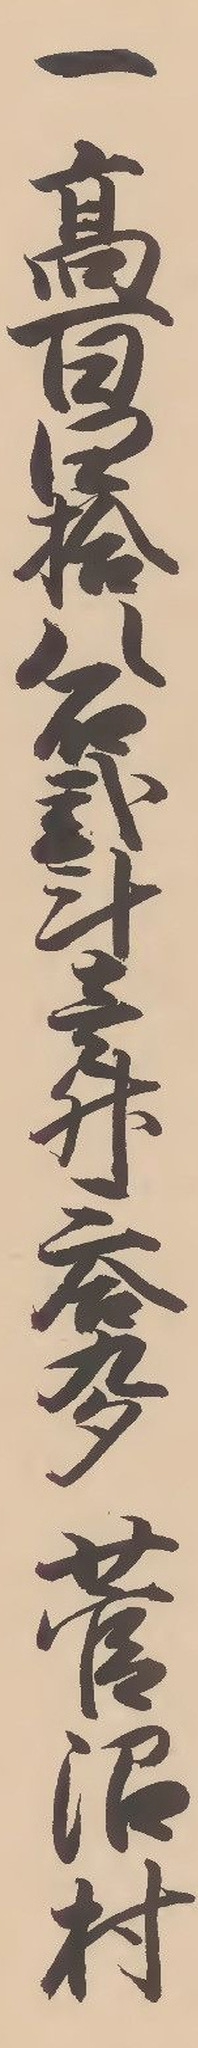一高百四拾八石弐斗壱升三合九勺菅沼村

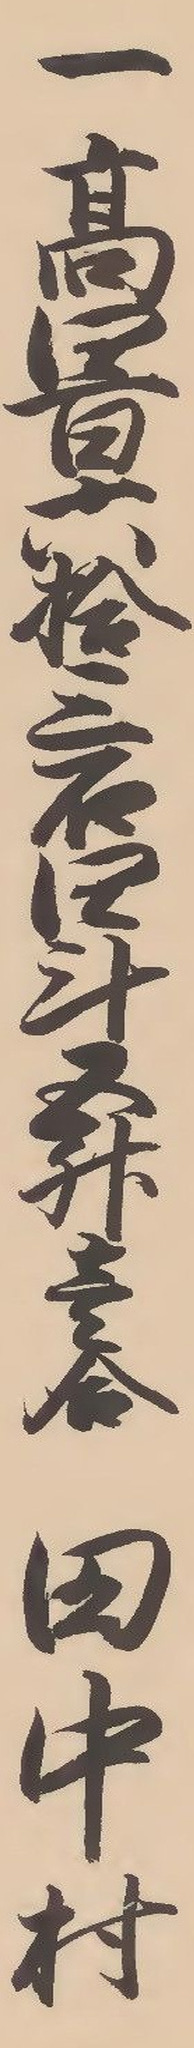一高四百六拾三石四斗五升壱合田中村
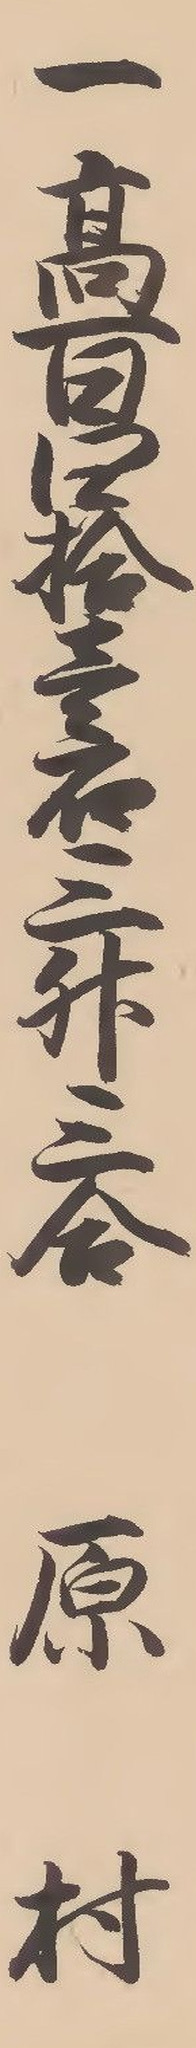一高百四拾壱石三升三合原村
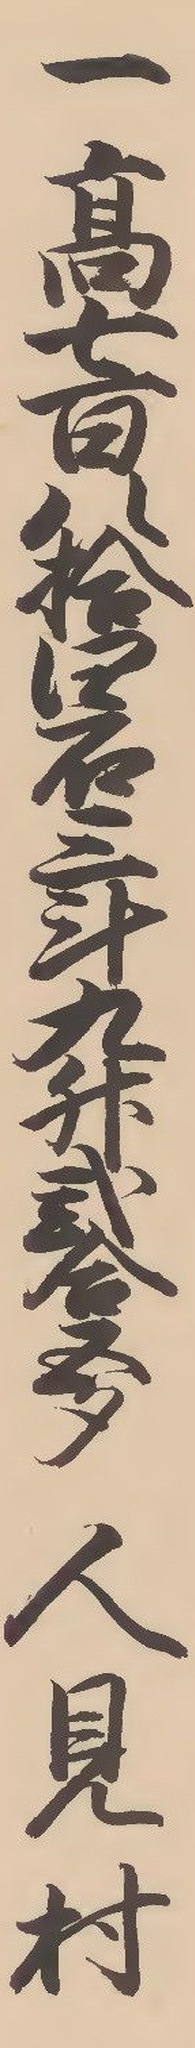一高七百八拾四石三斗九升弐合五勺人見村
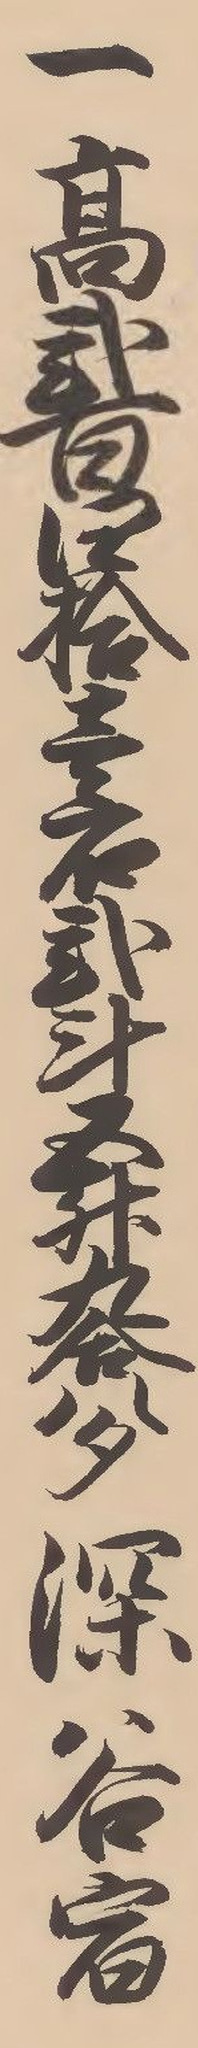一高弐百四拾壱石弐斗五升九合八勺深谷宿
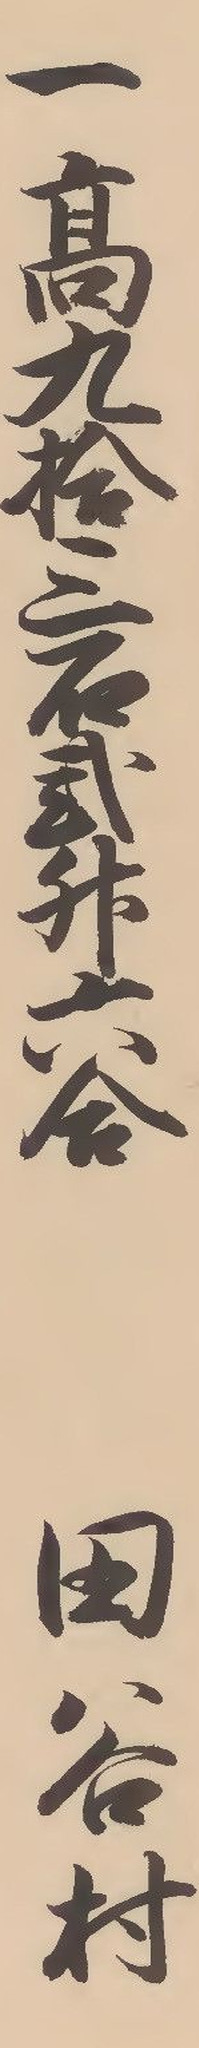一高九拾三石弐升六合田谷村
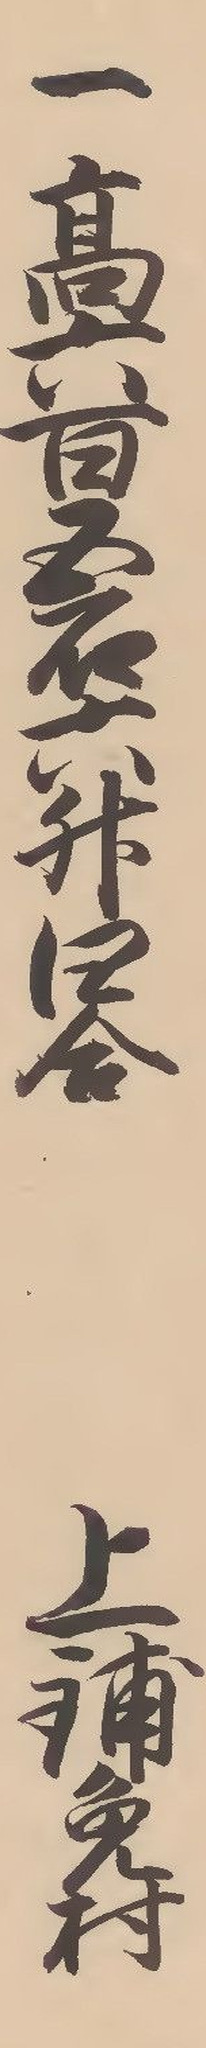一高六百五石六升四合上鋪免村
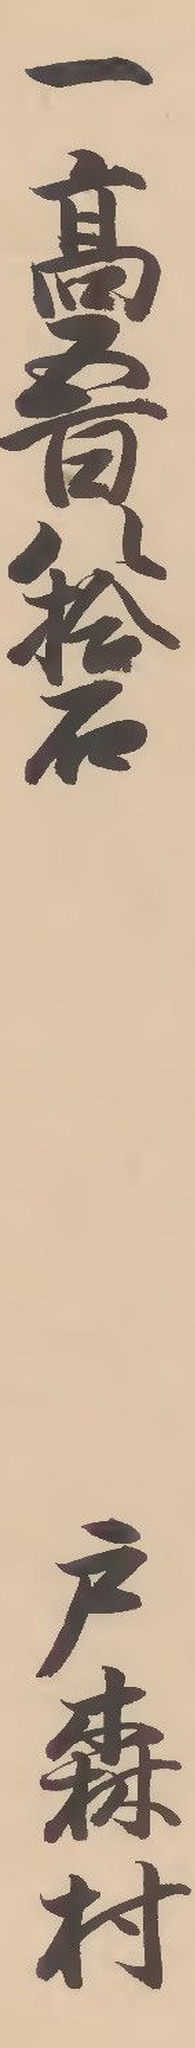一高百八拾石戸森村

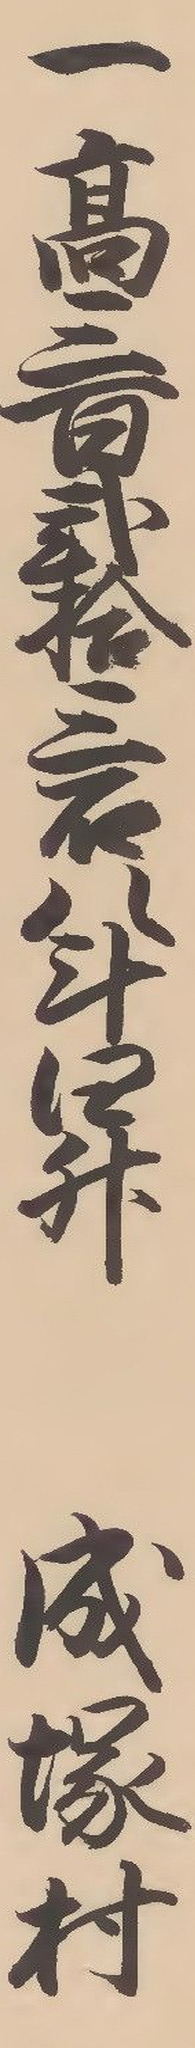一高三百弐拾三石八斗四升成塚村
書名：武蔵国郷帳　下
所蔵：国立公文書館 National Archives of Japan
